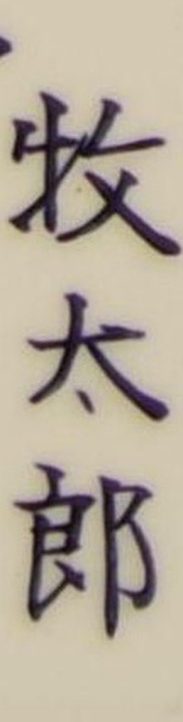牧太郎
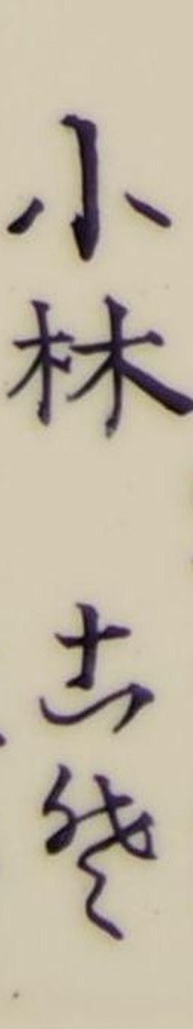小林こそ
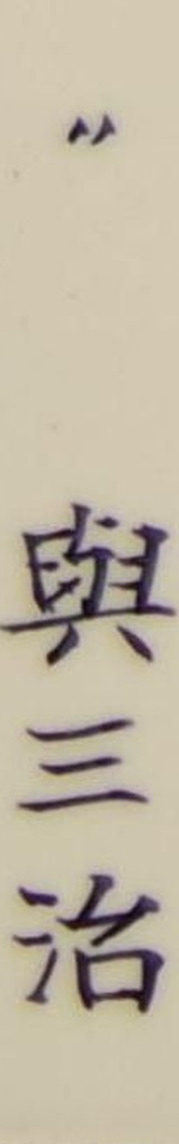與三治
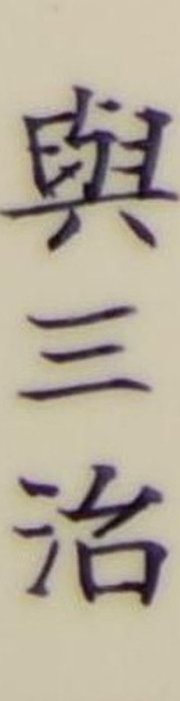與三治

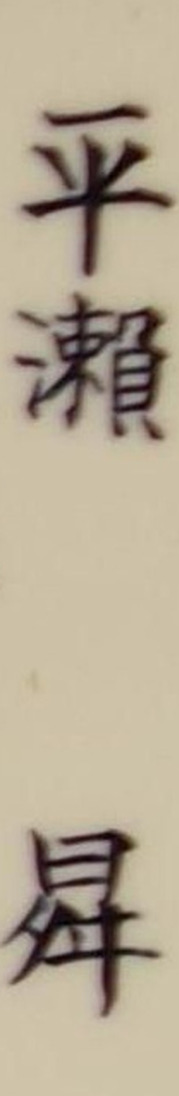平瀬昇
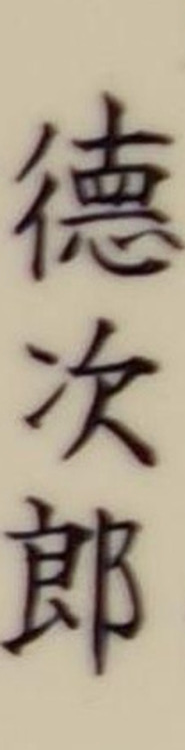徳次郎
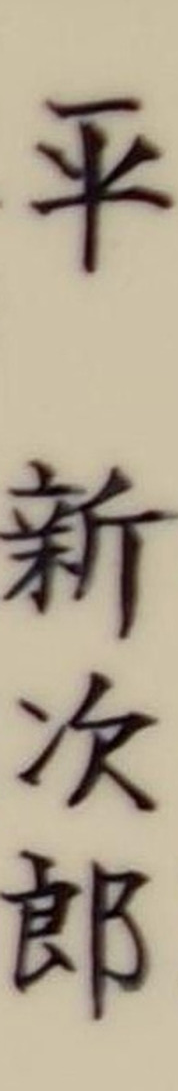平新次郎
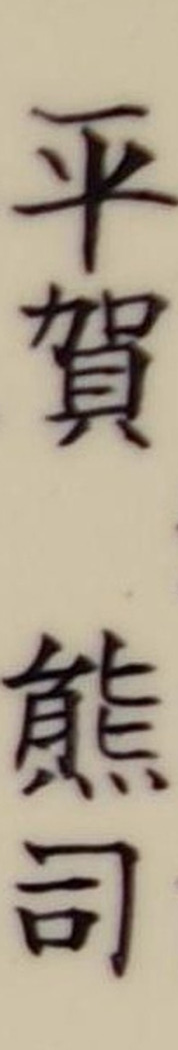平賀熊司
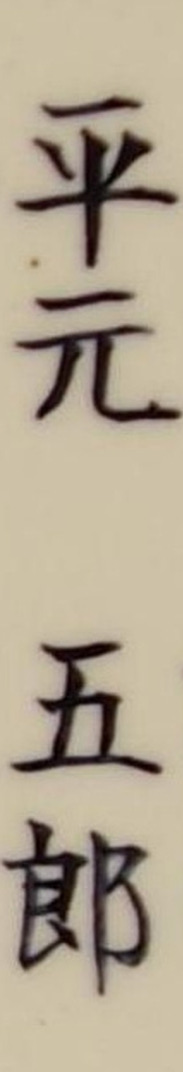平元五郎
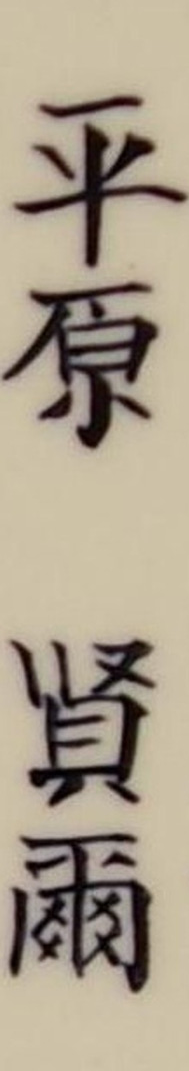平原賢爾
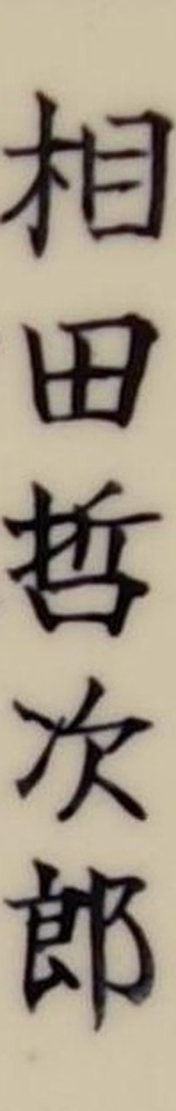相田哲次郎
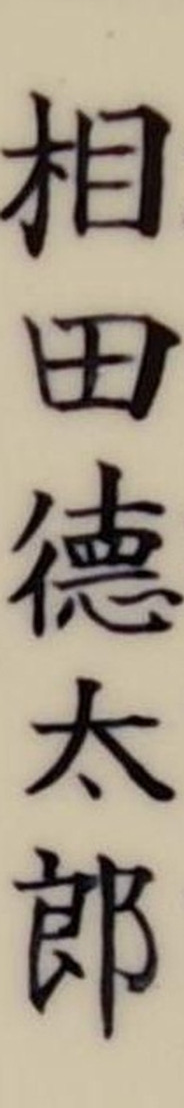相田徳太郎
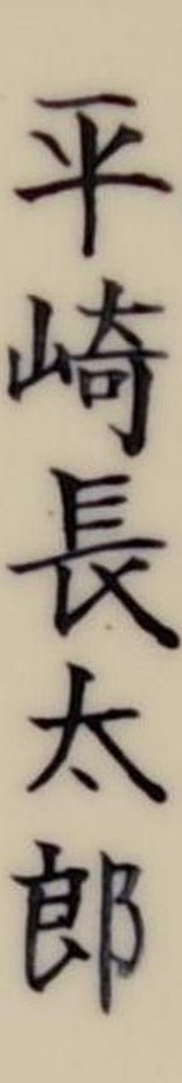平崎長太郎
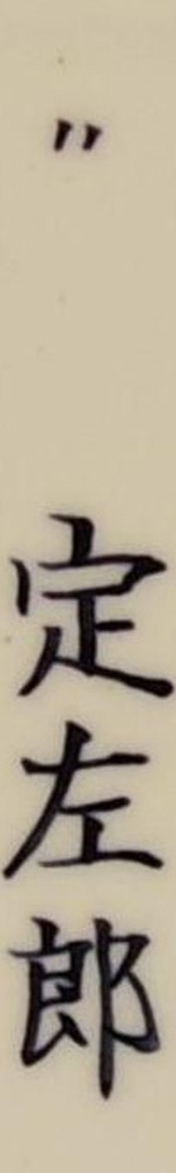定左郎
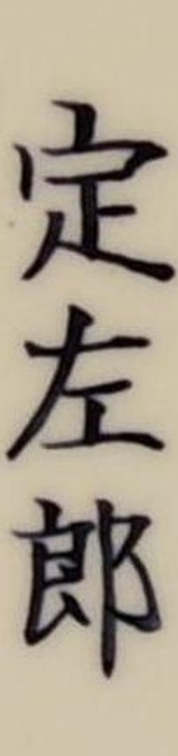定左郎
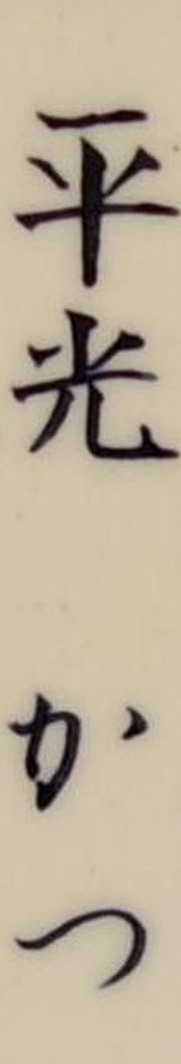平光かつ
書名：A~D
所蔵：koyasan kongobuji
